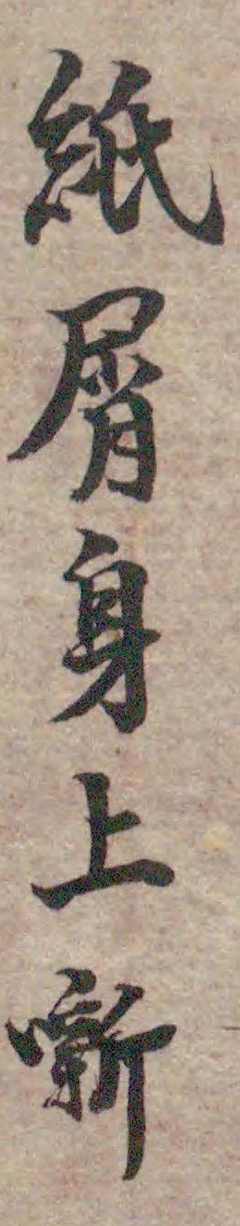紙屑身上噺

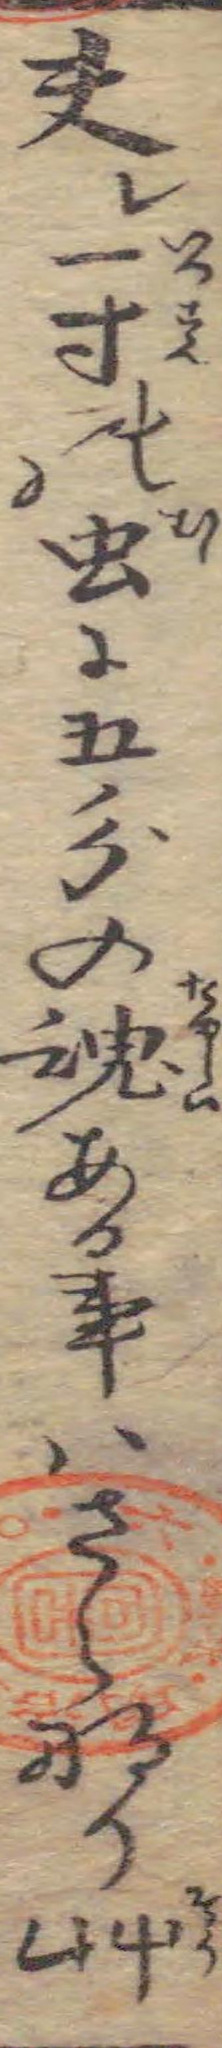夫一寸の虫に五分の魂ある事はさらなり艸
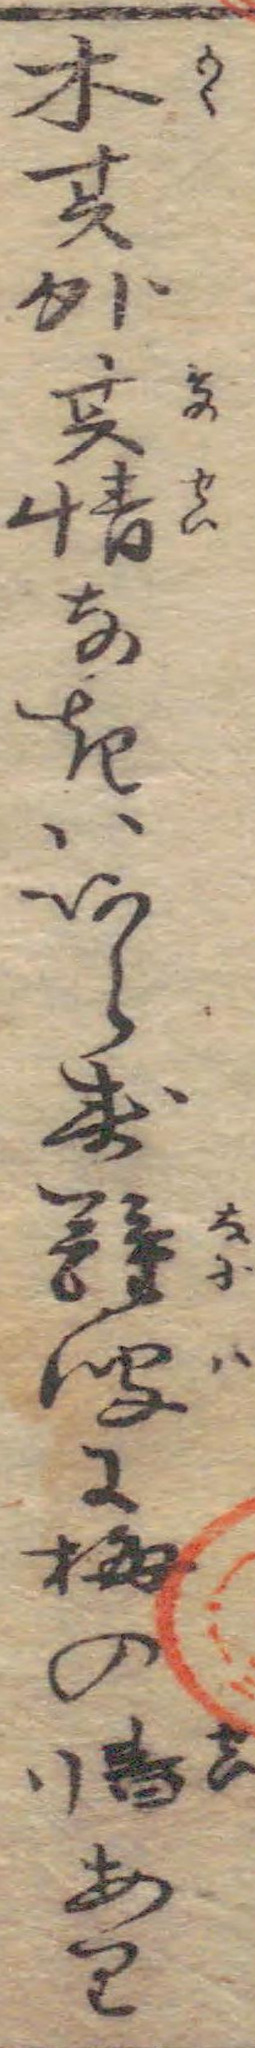木其外其情なきはあらす難波に梅の情あり
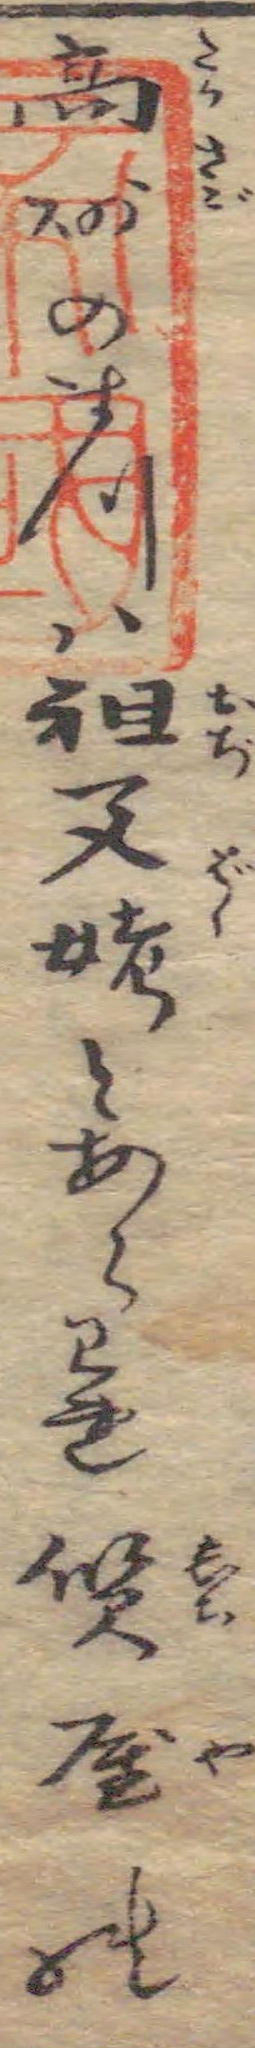高砂のまつは祖父姥とあらわれ質屋の
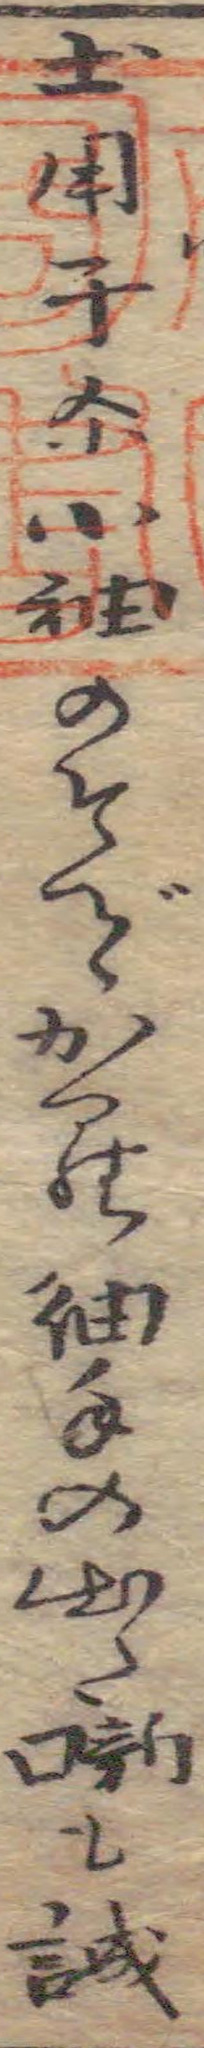土用干に小袖のそでから細手の出た噺も誠
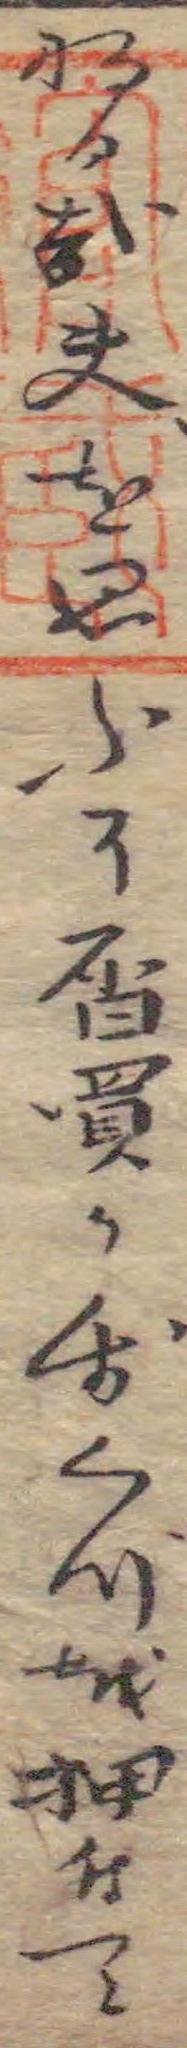なる哉夫を思ふに屑買か帋くづを押付て
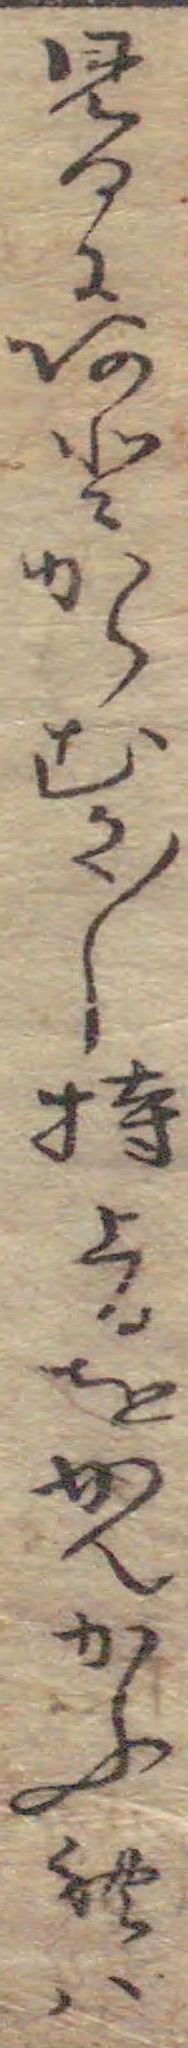見るにあとからむく〳〵持上るをかんかふれは
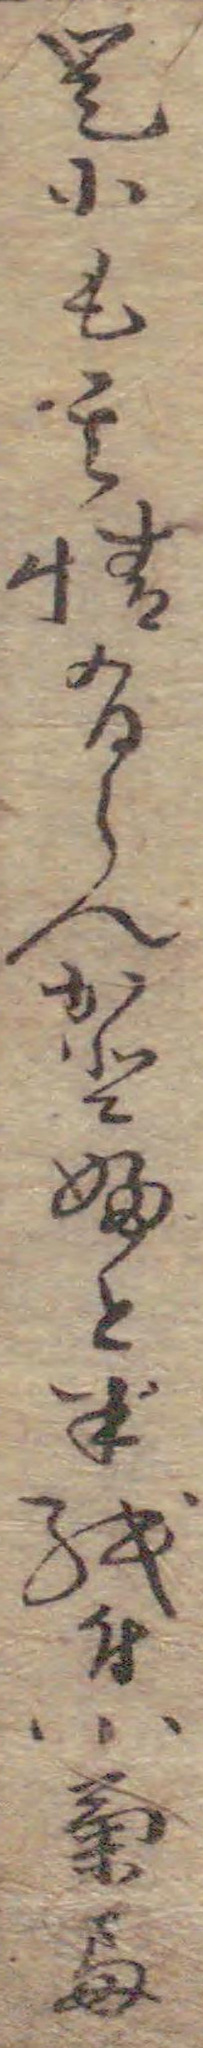是にも其情有らんかとふと半紙付小菊さま

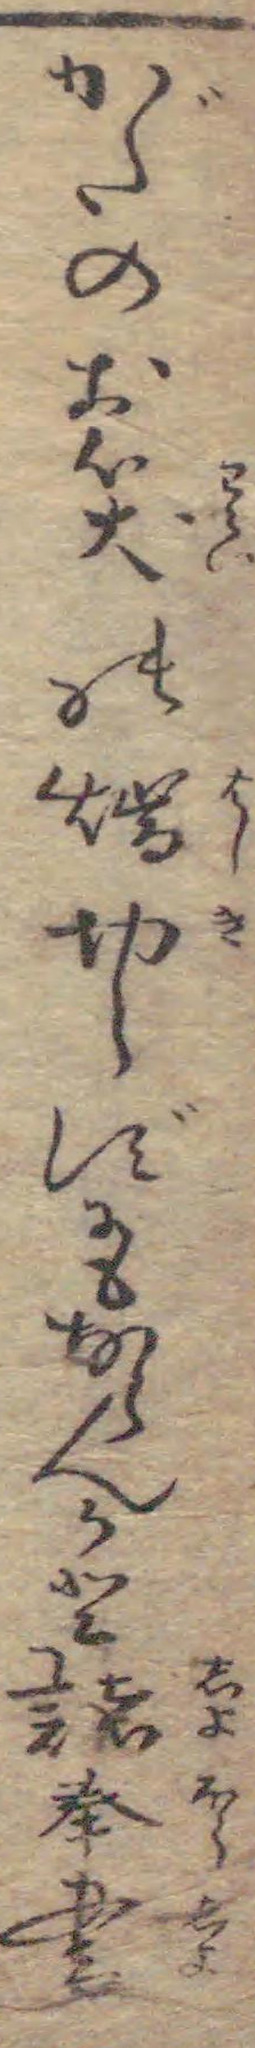がたのお笑の端切らずにもならんかと諸奉書
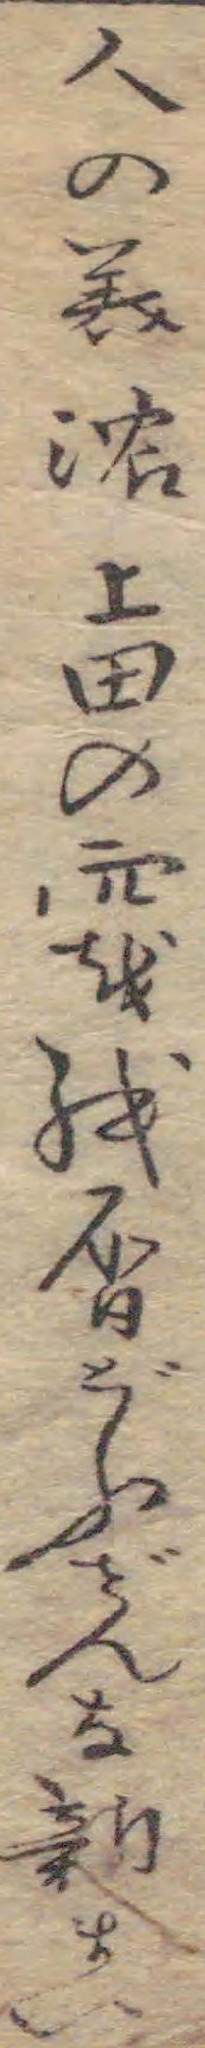人の美濃上田の穴を紙屑どふぜんな新まい
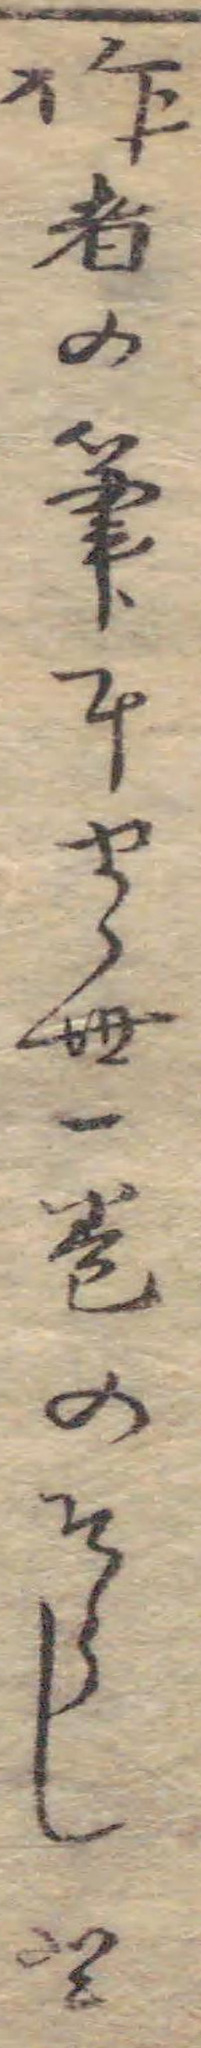作者の筆にまかせ一巻のそうしと
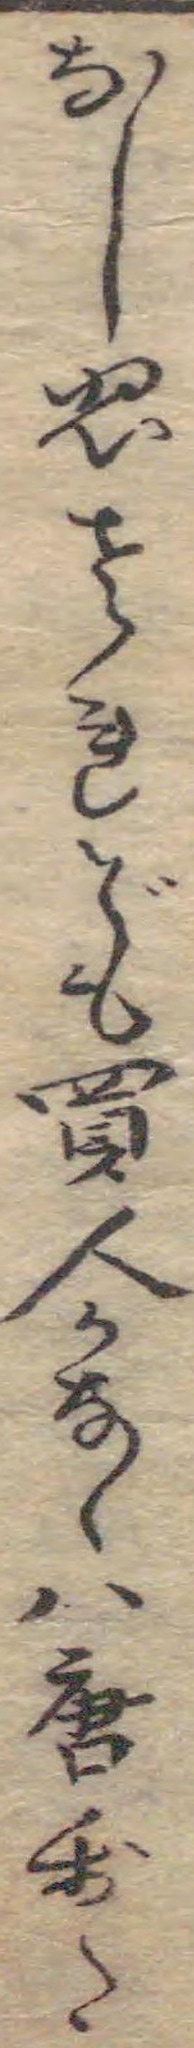なしぬされども買人かなくは唐帋た
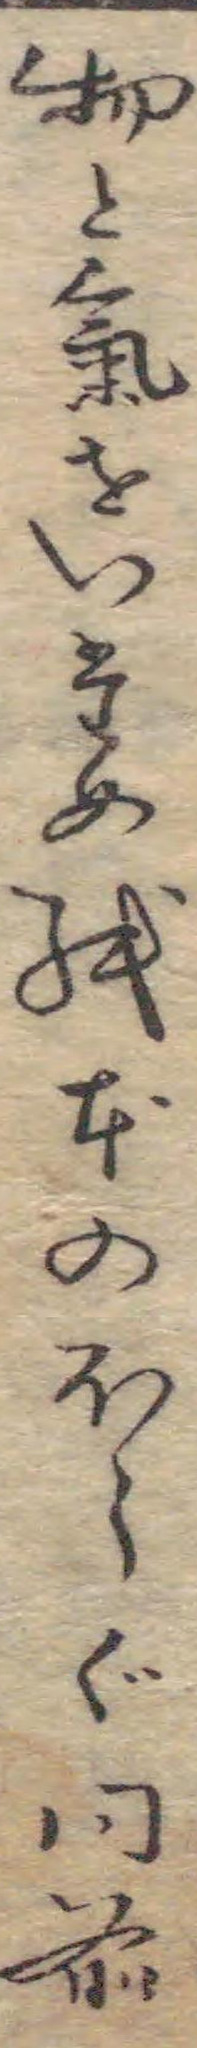物と気をいため紙本のほうぐ同前
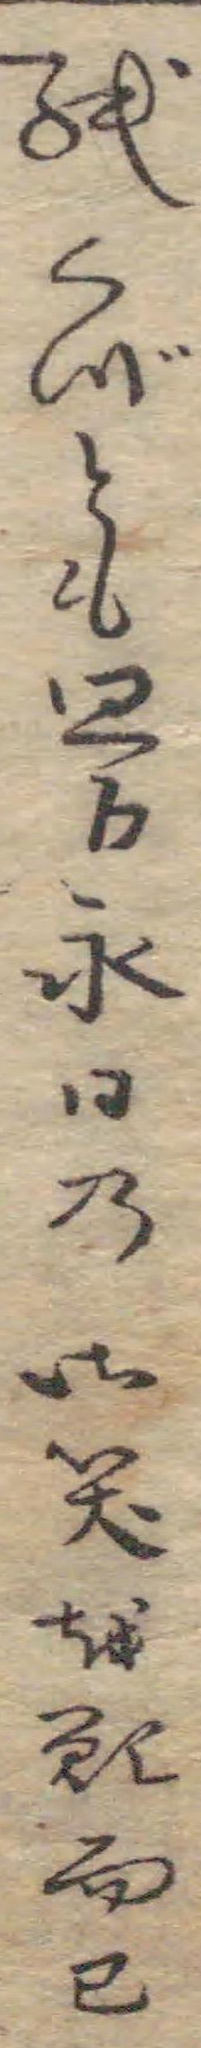紙くづとも思召永日の御笑を願而已
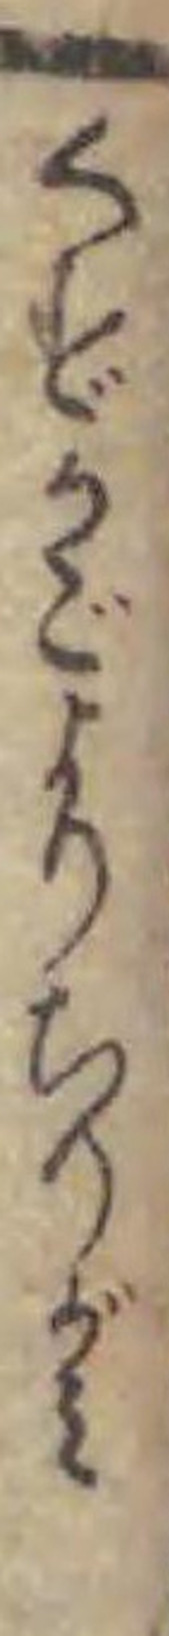くずかごよりちりがみ
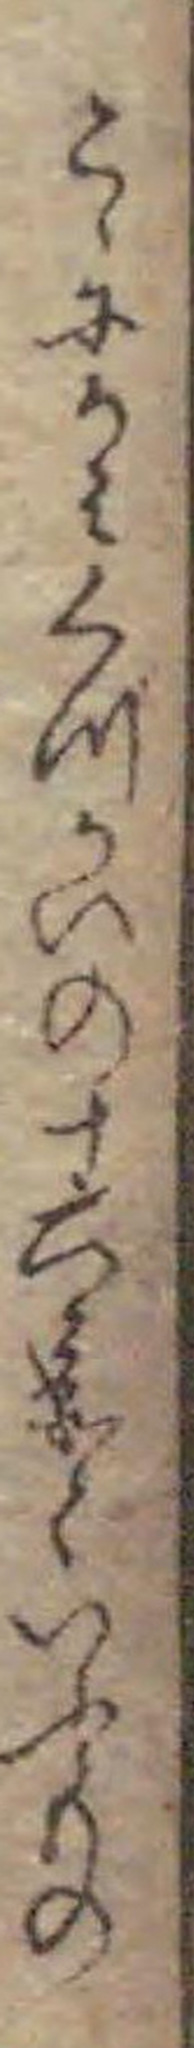こゝにかみくつかいの十六兵衛といふもの
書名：紙屑身上噺 : 3巻
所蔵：国立国会図書館 National Diet Library, JAPAN
